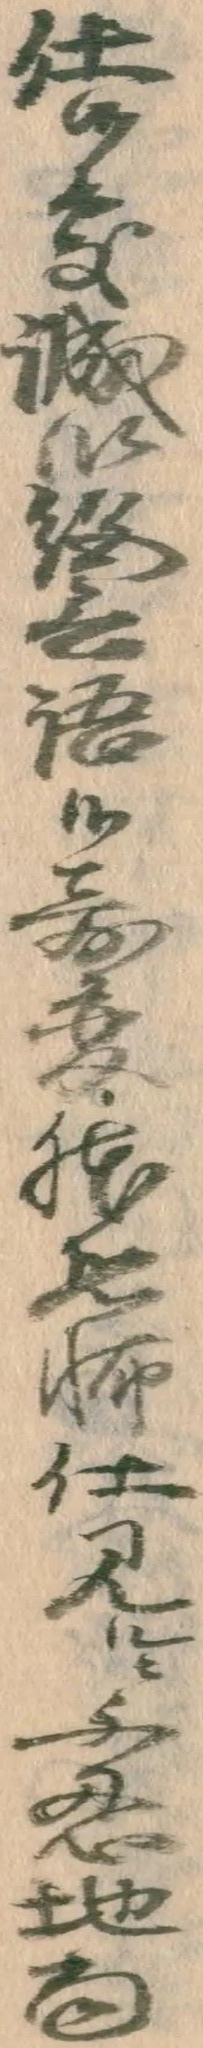仕候処誠以絶言語候寄変之躰恐怖仕見ルニ不忍地面
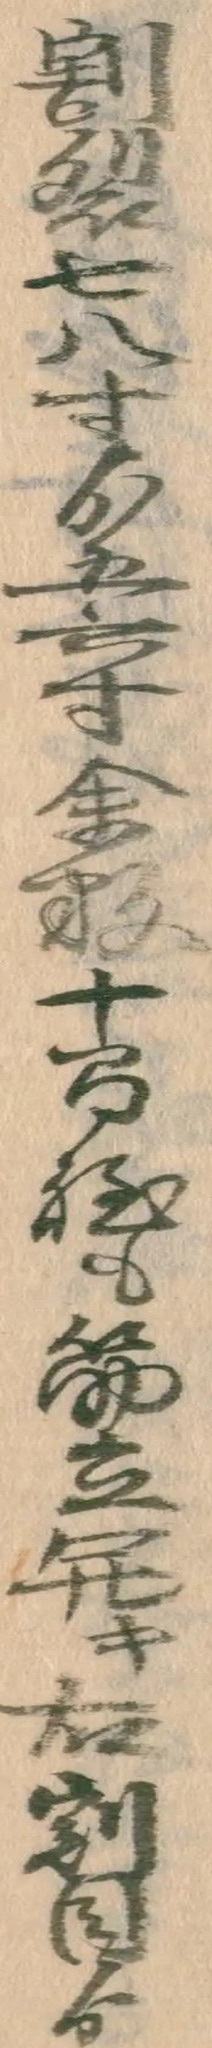割裂七八寸ゟ五六寸余数十間程も筋立開キ右割目ゟ
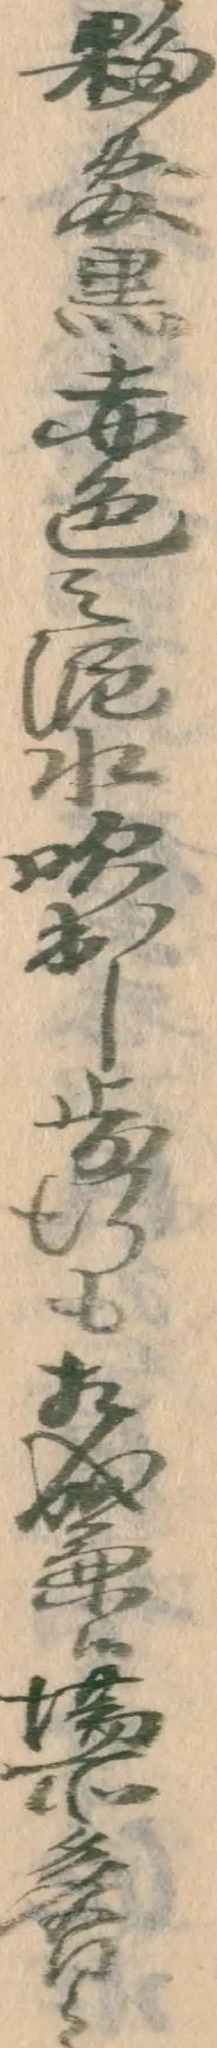夥敷黒赤色之泥水吹出し歩行も相成兼候場所多有之
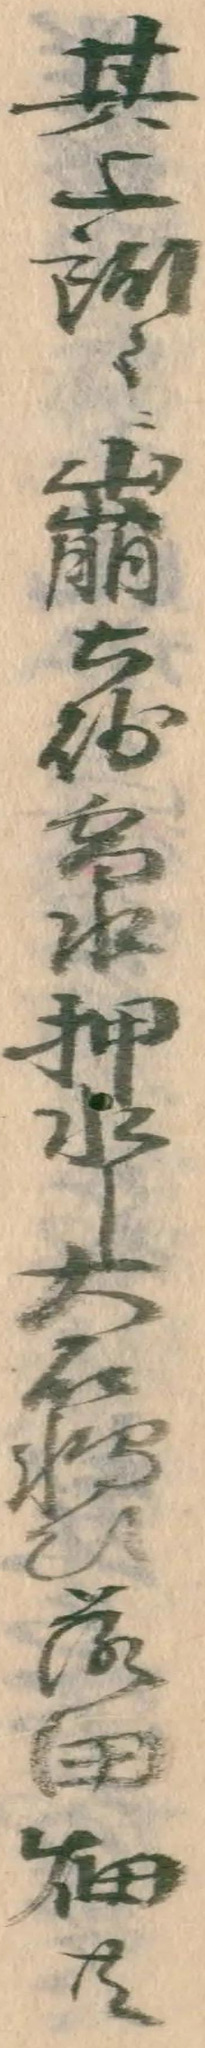其上所々二山崩土砂悪水押水し大石転ひ落田畑共
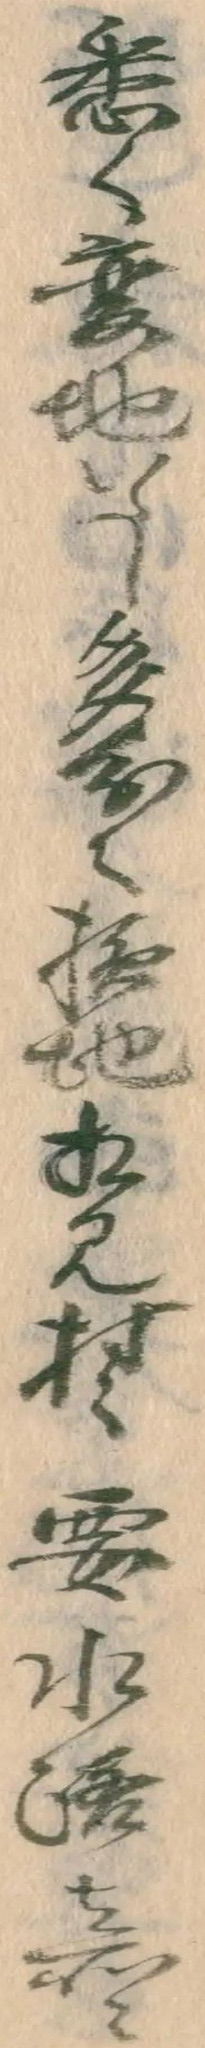悉く変地いたし多分之損地相見村々要水路者所々
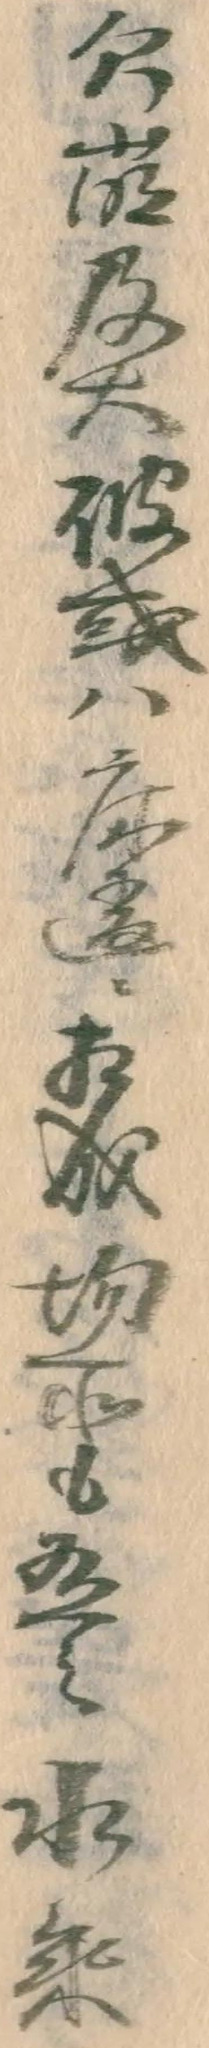欠落及大破或ハ床違ニ相成場所も有之水乗
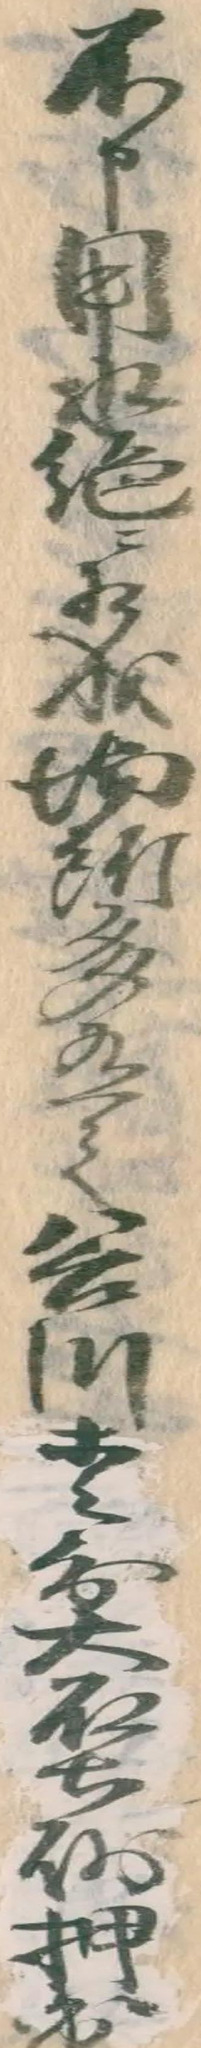不申用水絶ニ相成場所多有之谷川等之分大石土砂押出シ
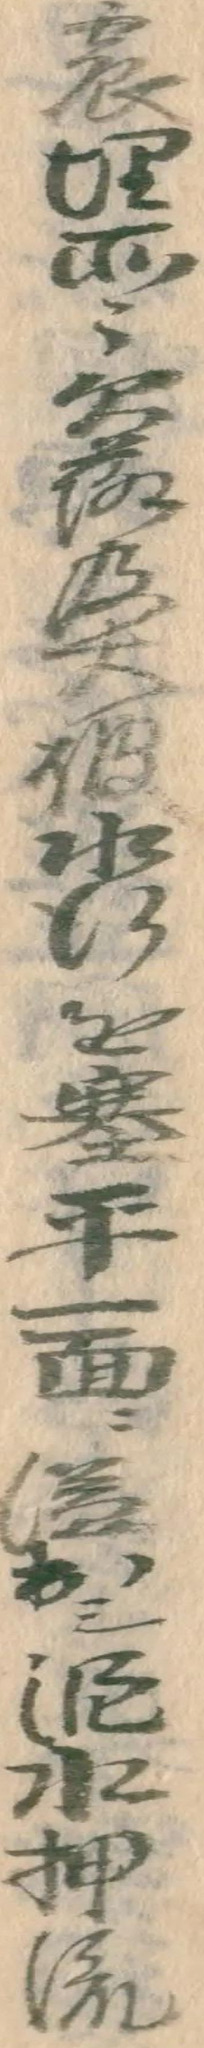震埋所々欠落及大破水行を塞平一面ニ溢出シ泥水押流
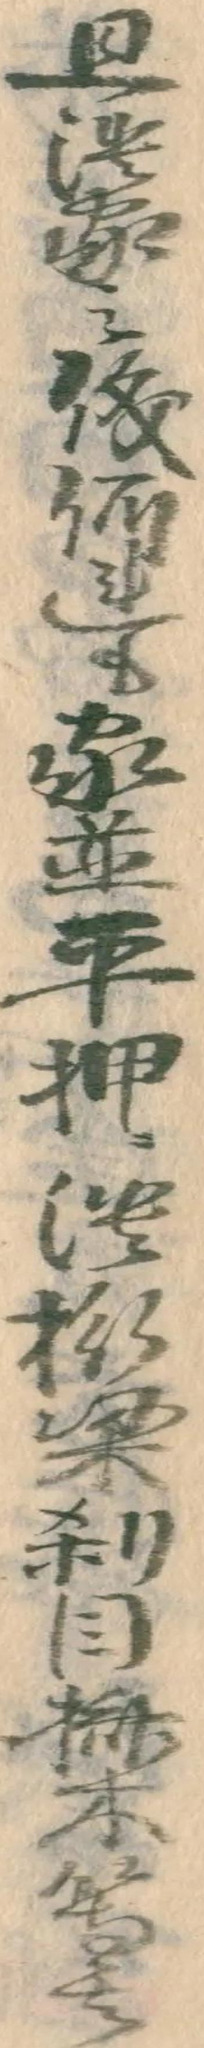且潰家之儀何れも家並平押ニ潰桁梁矧目臍木等其
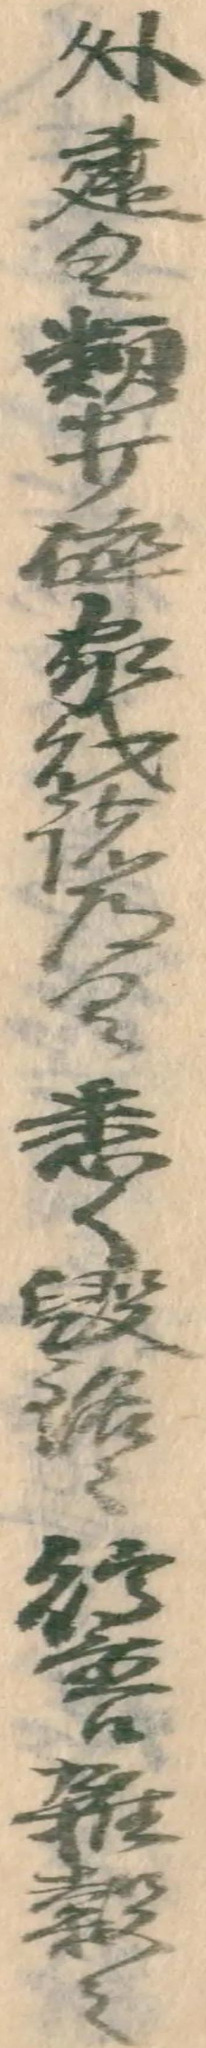外建具類打砕家財諸道具悉打毀銘々貯置候雑穀之
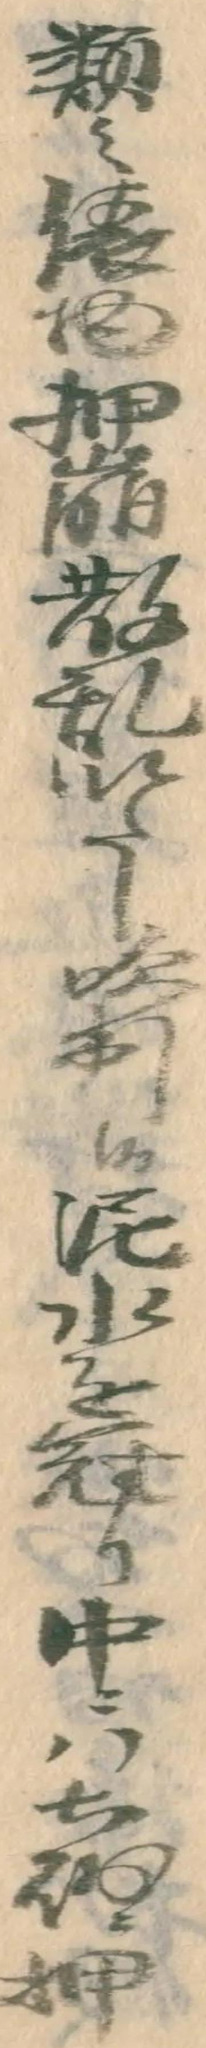類之俵物押崩散乱いたし吹出し候泥水を冠り中二ハ土砂二押

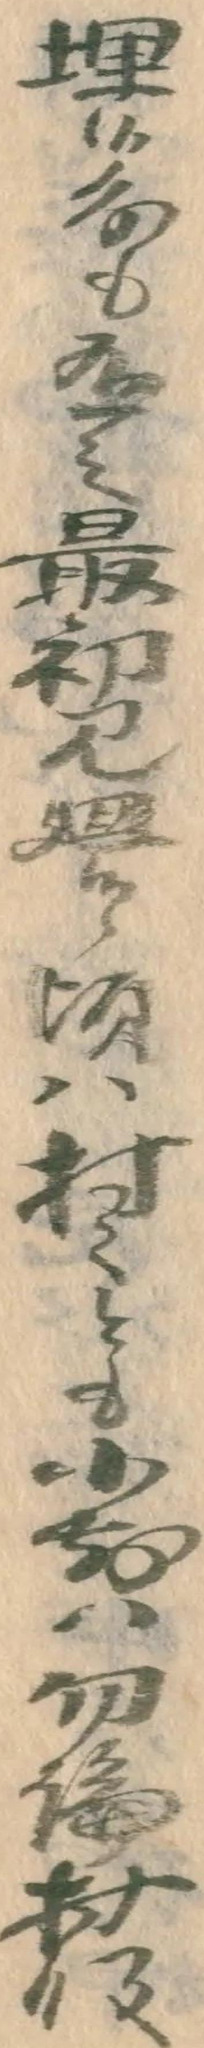埋候分も有之最初見廻り候頃ハ村々とも小前ハ勿論村役
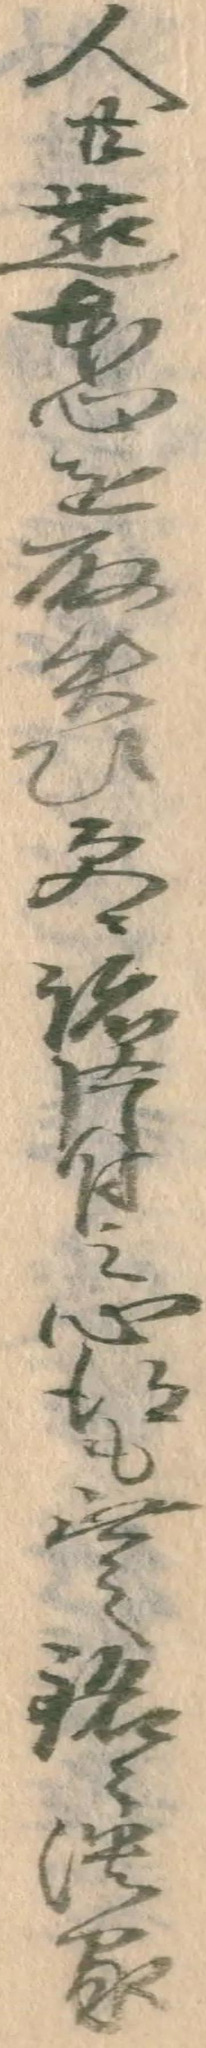人共迄本心を取失ひ更ニ後取片付之心得も無之銘々潰家
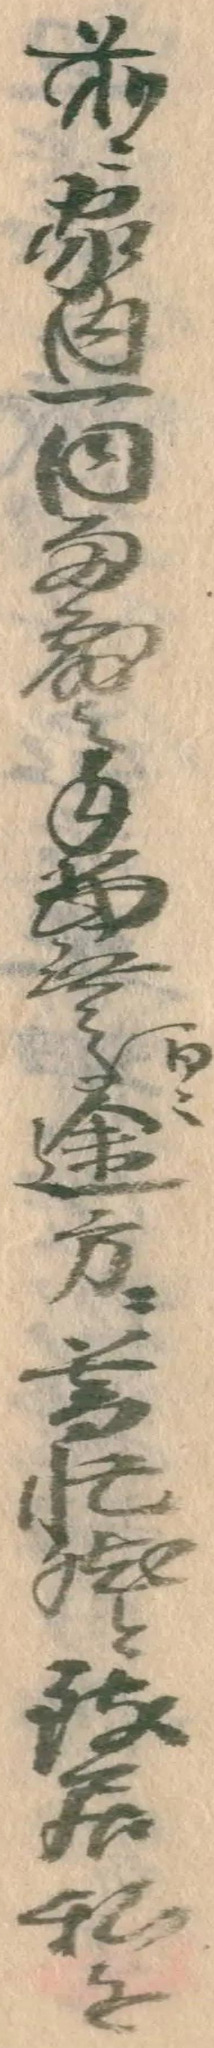前ニ家内一同雨露之手当無之只々途方ニ暮忙然と致居私を
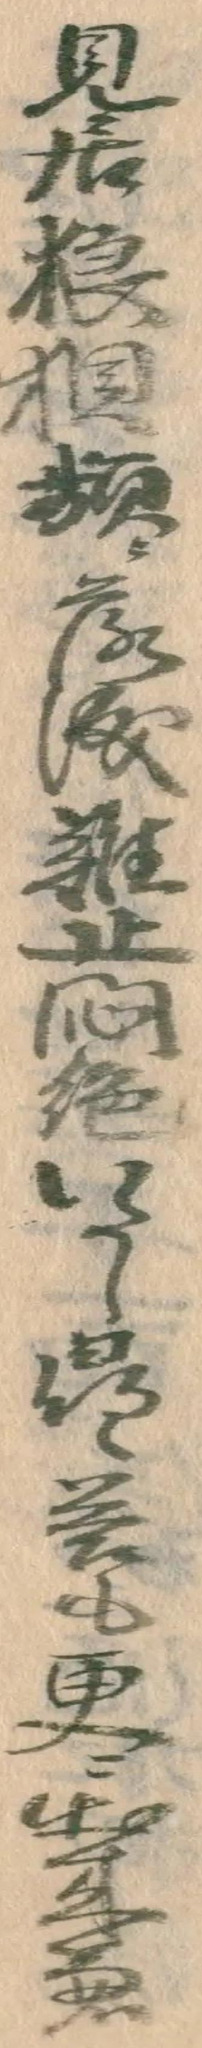見居狼狽頻落涙難止悶絶いたし尋候答も更二出来兼
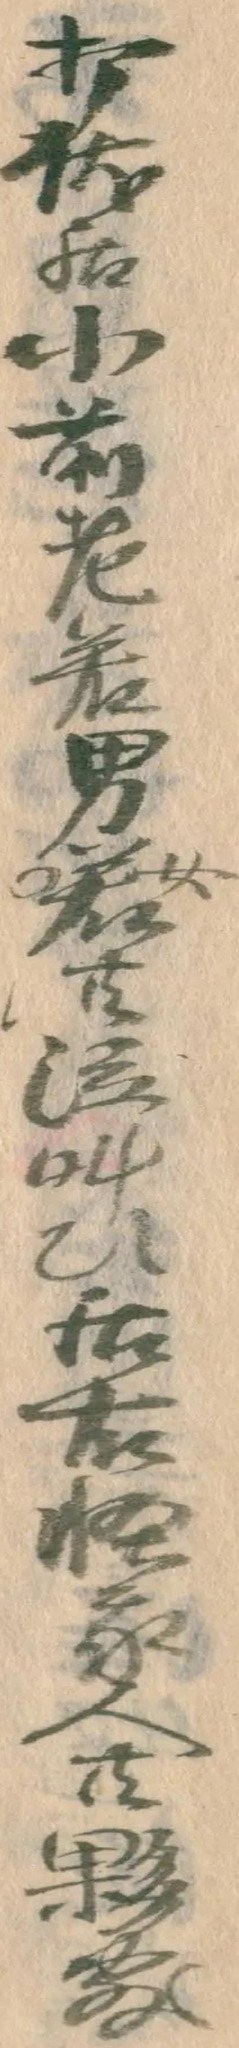打伏居小前老若男女共泣叫ひ居右怪我人共夥敷
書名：信州大地震之記
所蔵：国立国会図書館 National Diet Library, JAPAN
